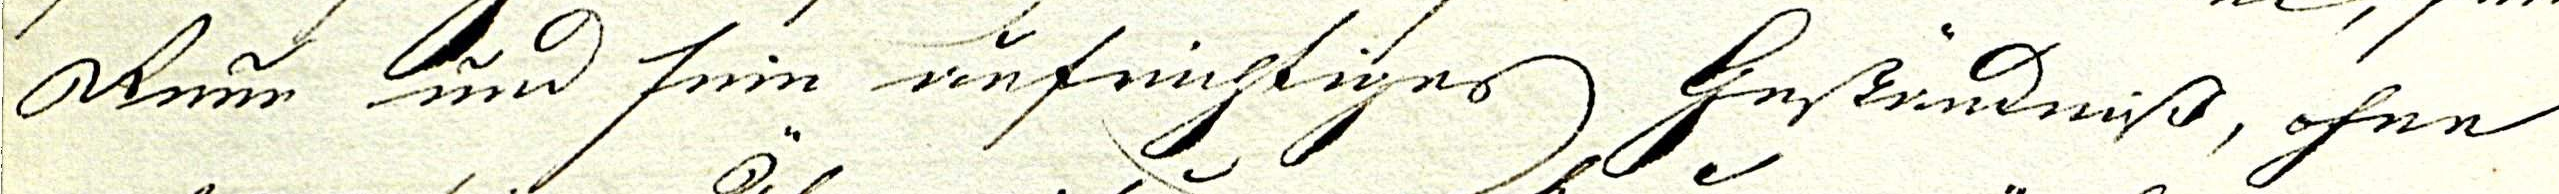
Reue und sein aufrichtiges Geständniß, ohne
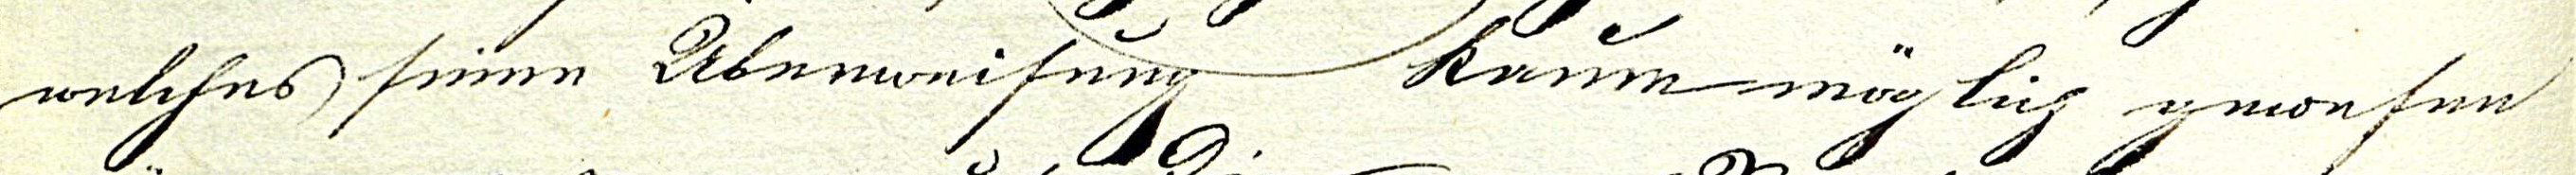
welches seine Überweisung kaum möglich gewesen
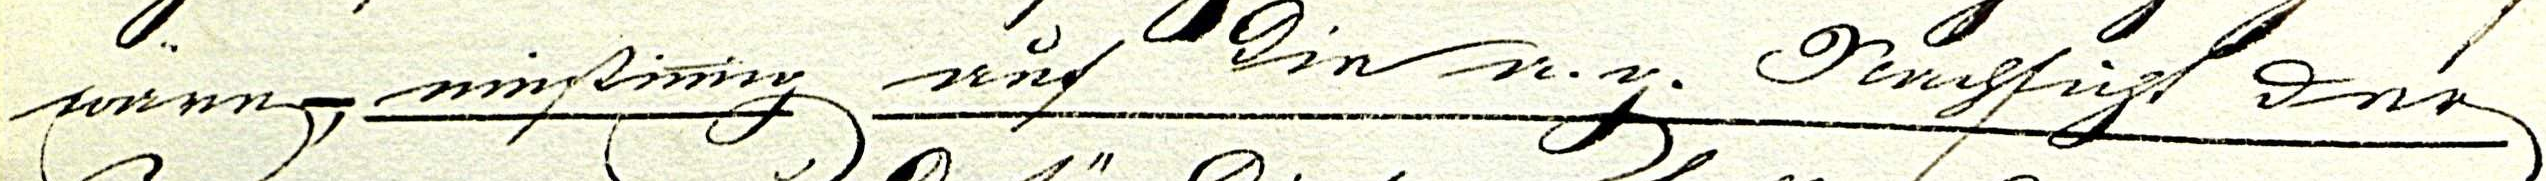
wäre—einstimmig auf die a.g. Nachsicht der
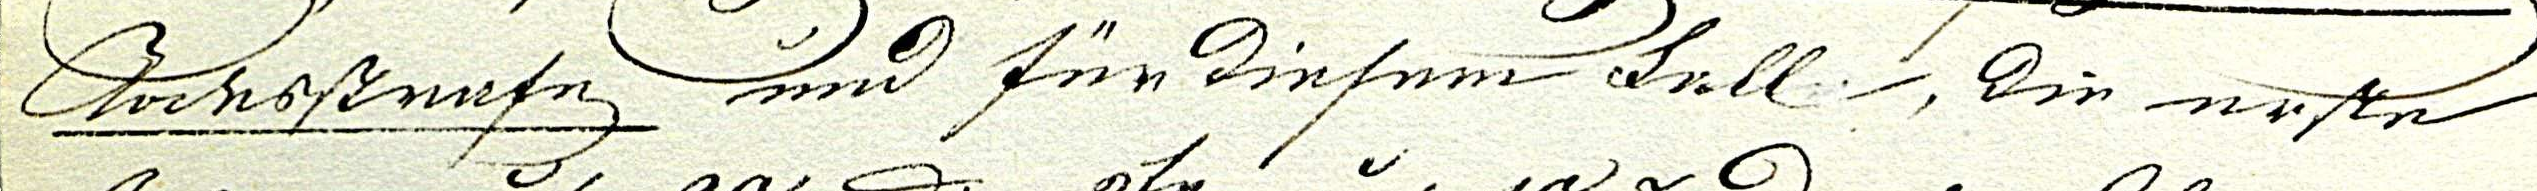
Todesstrafe und für diesem Fall, die erste
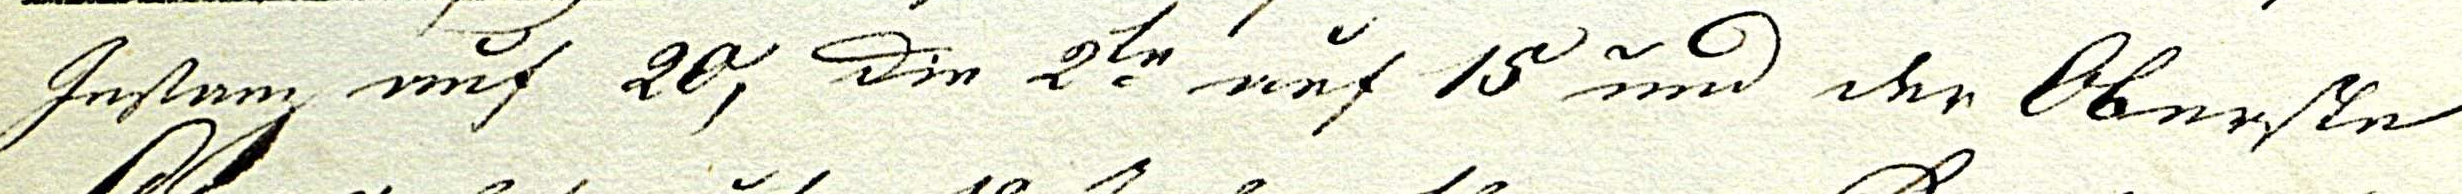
Instanz auf 20, die 2te auf 15 und der Oberste
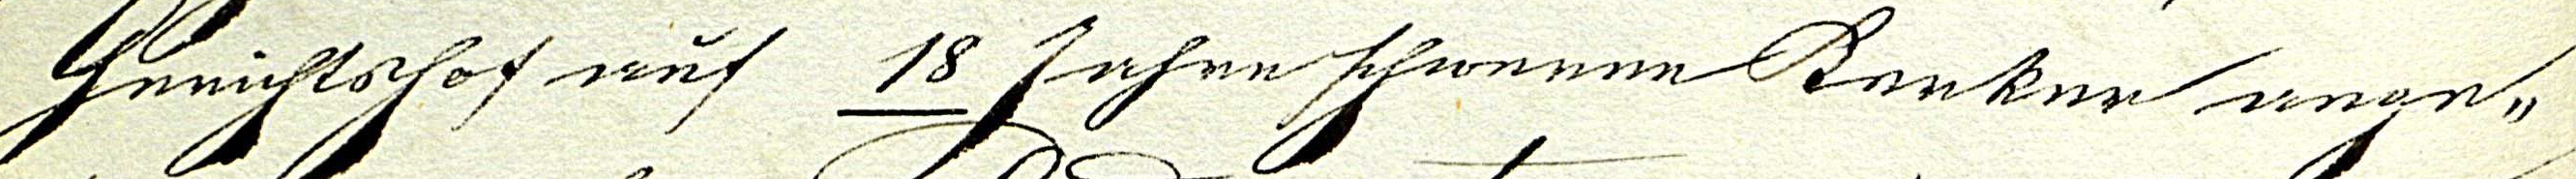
Gerichtshof auf 18 Jahre schweren Kerker ange¬
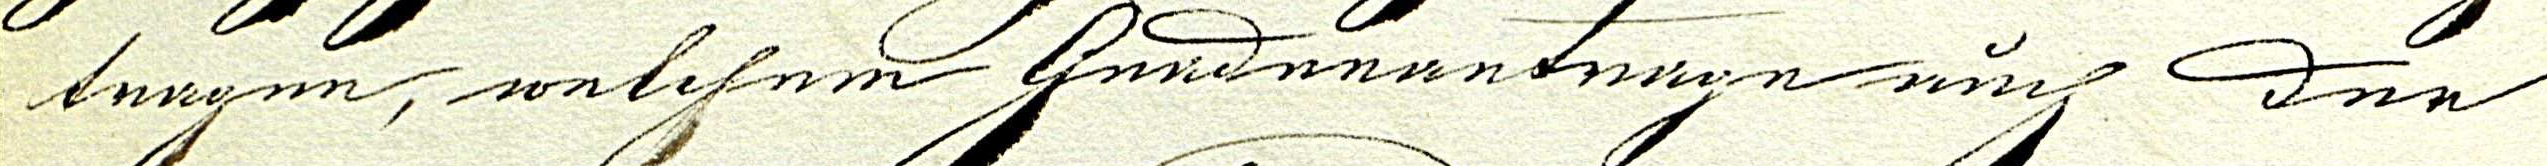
tragen, welchem Gnadenantrage auch der
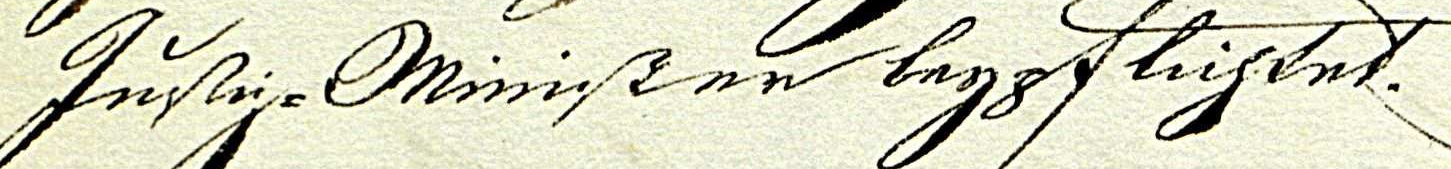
Justiz-Minister beypflichtet.
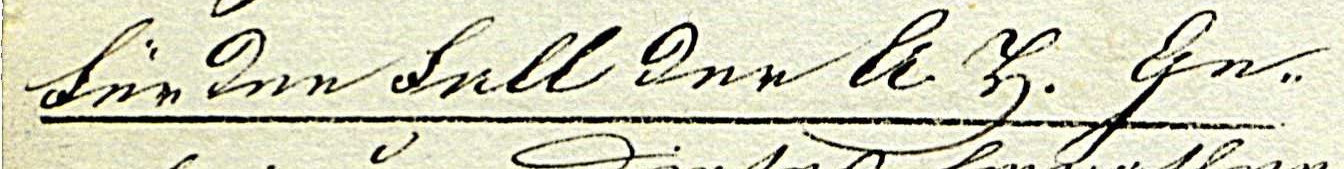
Für den Fall der A. H. Ge¬
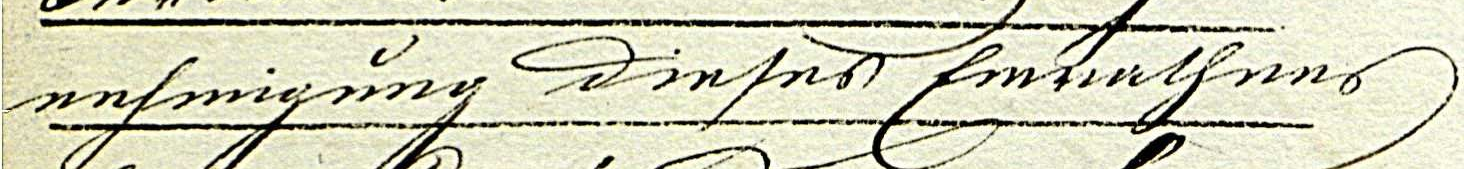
nehmigung dieses Einrathens
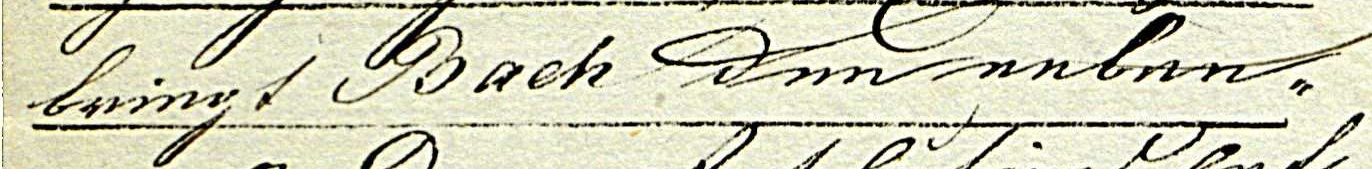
bringt Bach den nebes¬
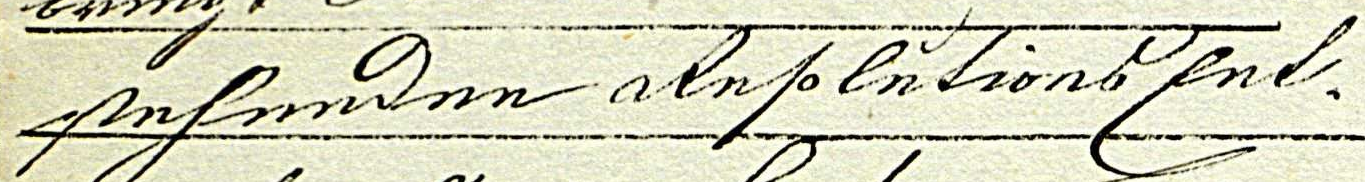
tehenden Resolutions Ent¬
